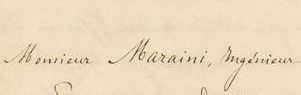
Monsieur Maraini, Ingénieur
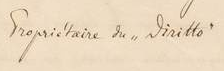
Propriétaire du «Diritto»
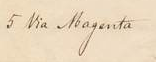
5. Via Magenta
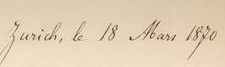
Zurich, le 18 Mars 1870
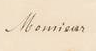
Monsieur
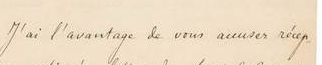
J'ai l'avantage de vous accuser récep-
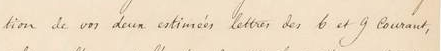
tion de vos deux estimées lettres des 6 et 9 Courant,
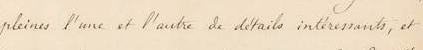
pleines l'une et l'autre de détails intéressants, et
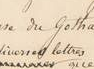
cause
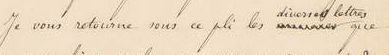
Je vous retourne sous ce pli les ...diverses lettres que
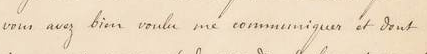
vous avez bien voulu me communiquer et dont
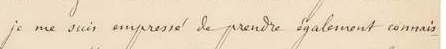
je me suis empressé de prendre également connais-
